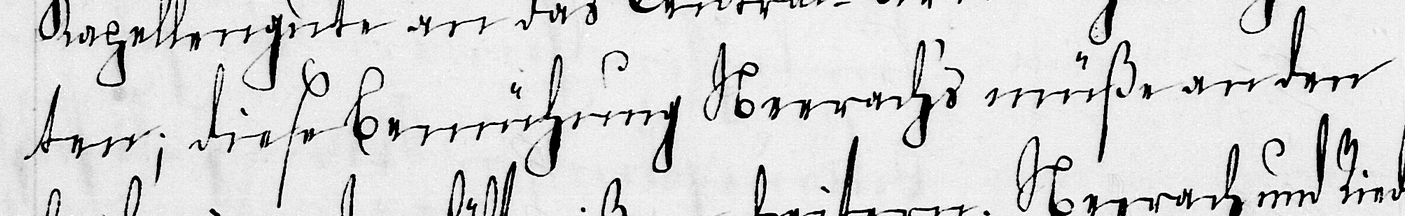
ten; diese Bemühung Neerach’s müße an den
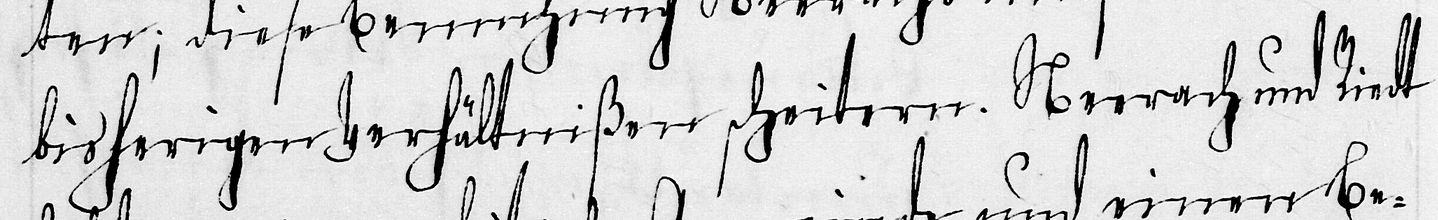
bisherigen Verhältnißen scheitern. Neerach und Riedt
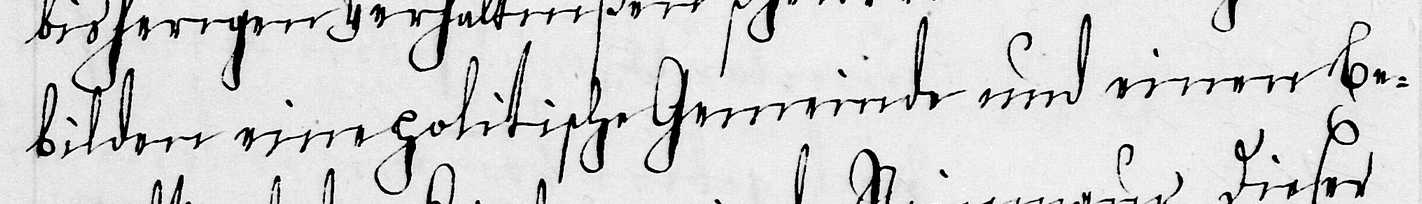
bilden eine politische Gemeinde und einen Be¬
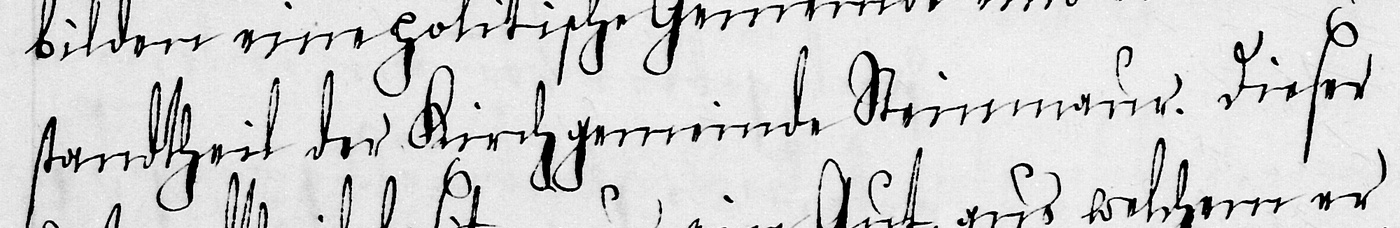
standtheil der Kirchgemeinde Steinmaur. Dieser
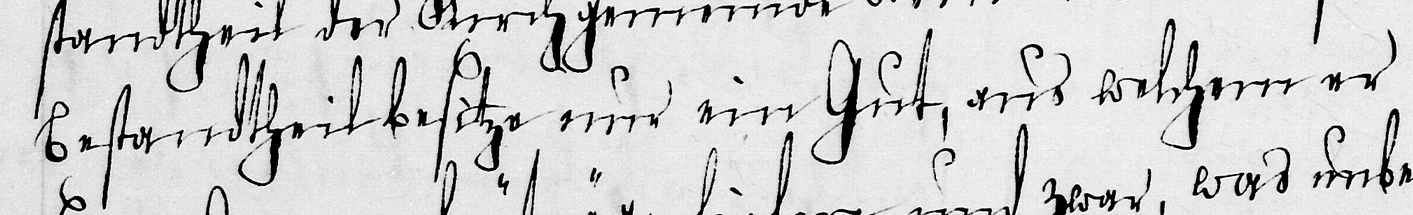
Bestandtheil besitze nur ein Gut, aus welchem er
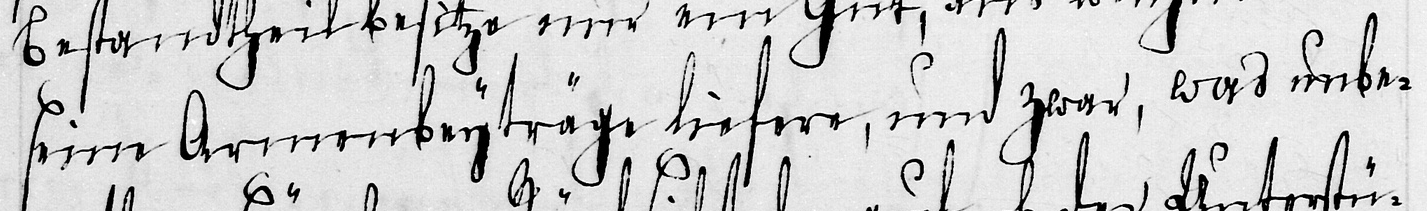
seine Armenbeyträge liefere, und zwar, was unbes¬
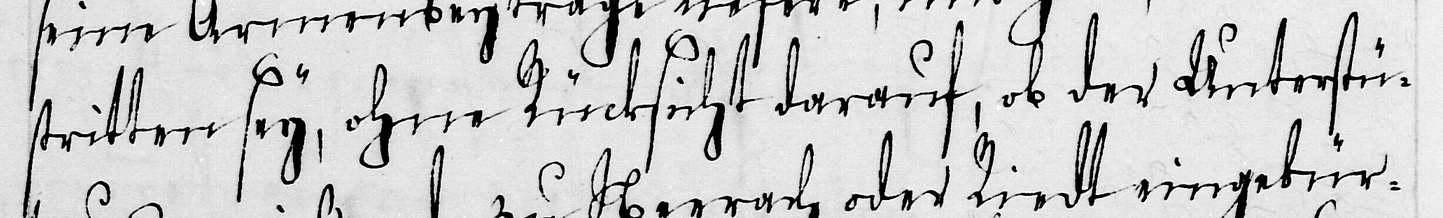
tritten sey, ohne Rücksicht darauf, ob der Unterstü¬
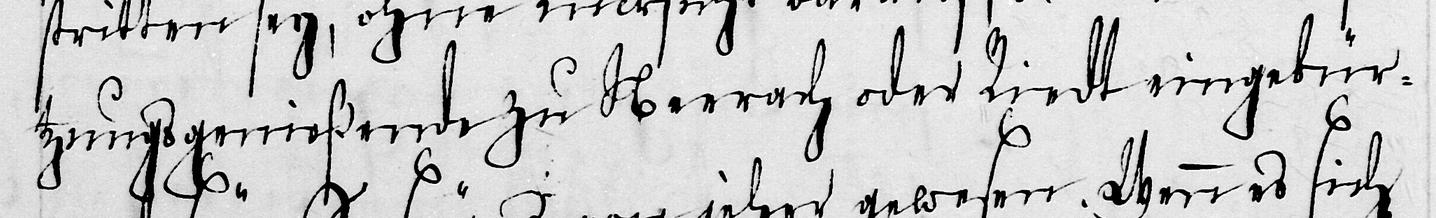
tzungsgenießende zu Neerach oder Riedt eingebür¬
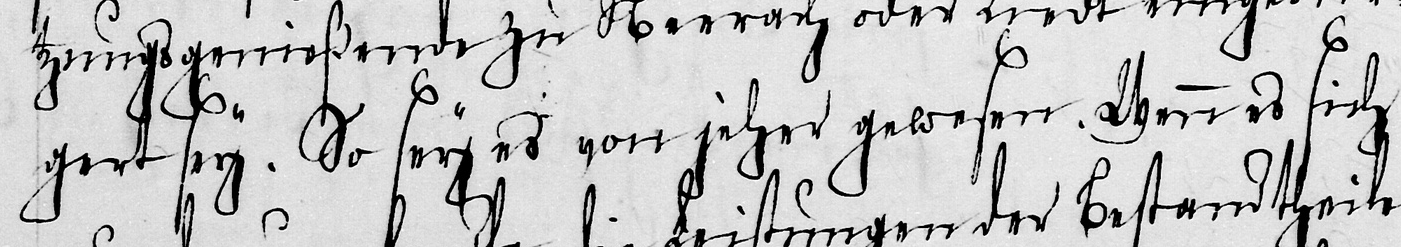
gert sey. So sey es von jeher gewesen. Wenn es sich
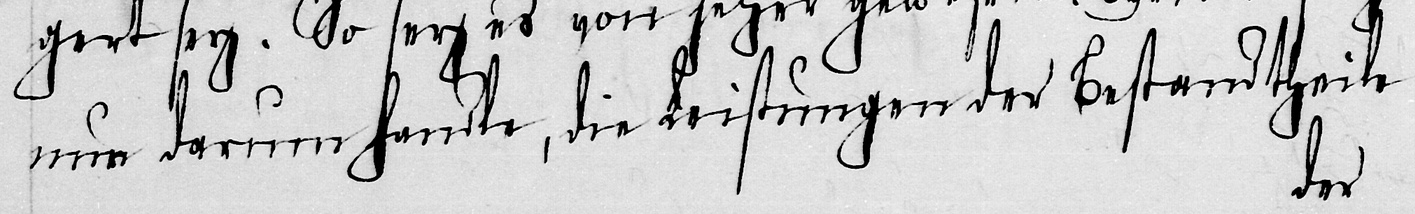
nun darum handle, die Leistungen der Bestandtheile
